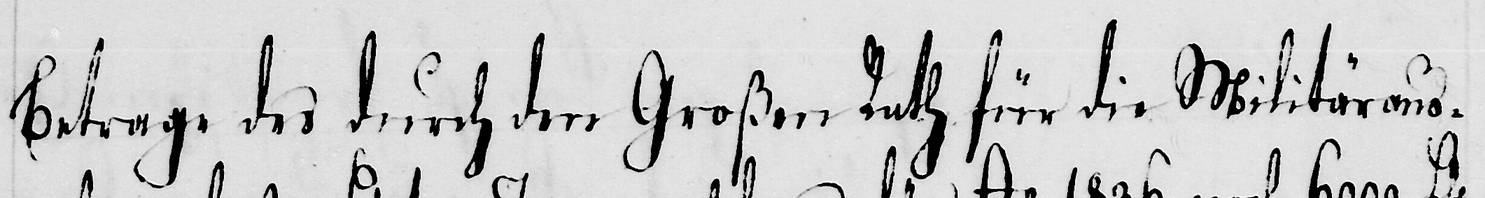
Betrag des durch den Großen Rath für die Militäraus¬
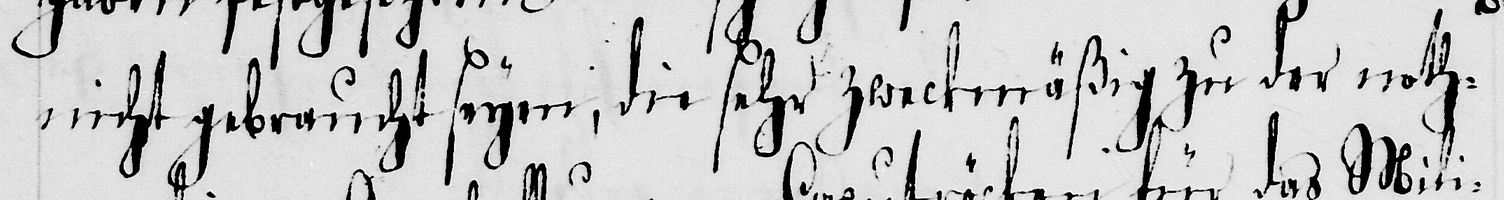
nicht gebraucht seyen, die sehr zweckmäßig zu der noth¬
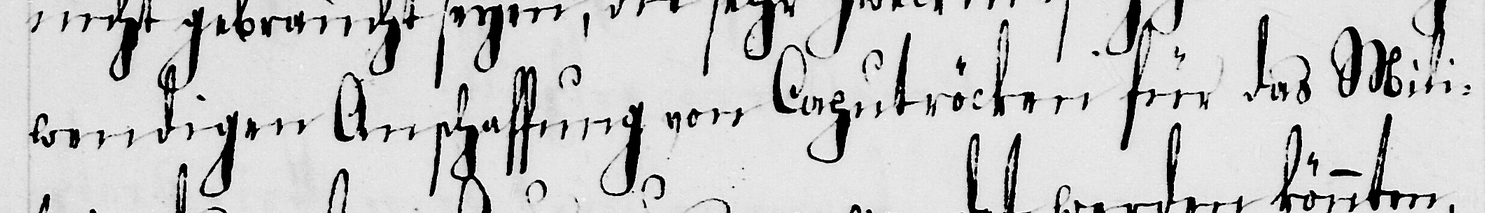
wendigen Anschaffung von Caputröcken für das Mili¬
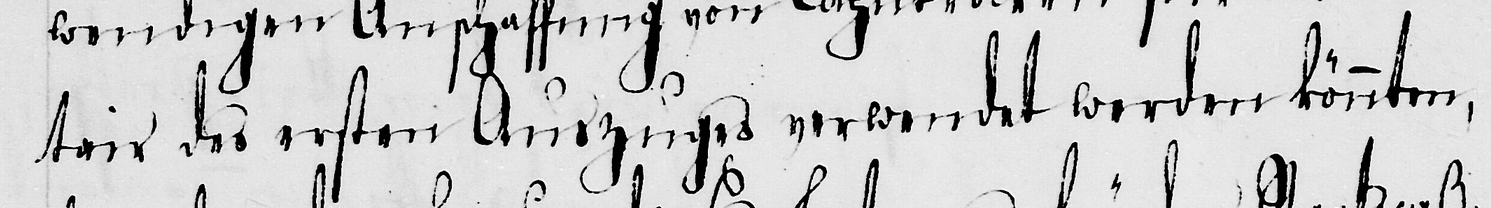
tair des ersten Auszuges verwendet werden könnten,
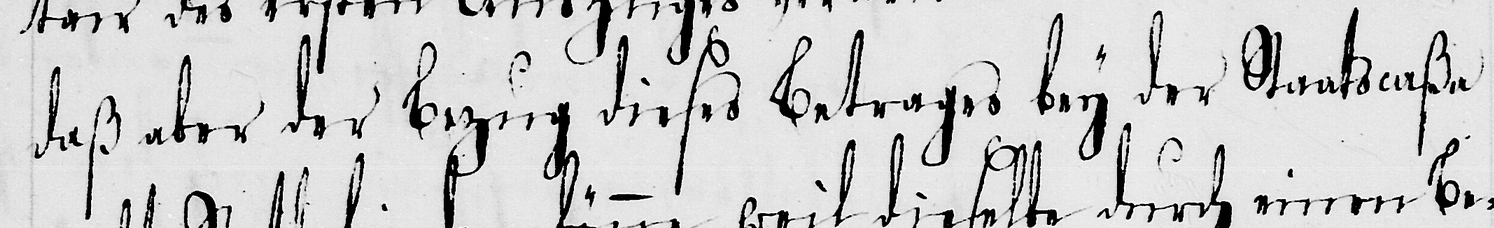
daß aber der Bezug dieses Betrages bey der Staatscaßa
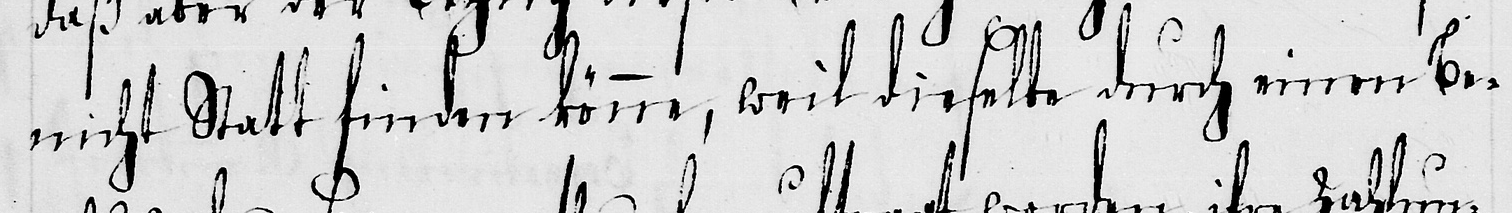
nicht Statt finden könne, weil dieselbe durch einen Be¬
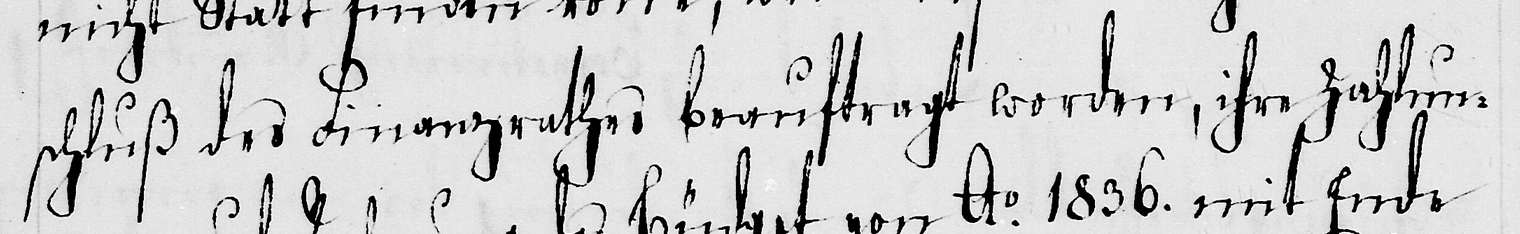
schluß des Finanzrathes beauftragt worden, ihre Zahlun¬
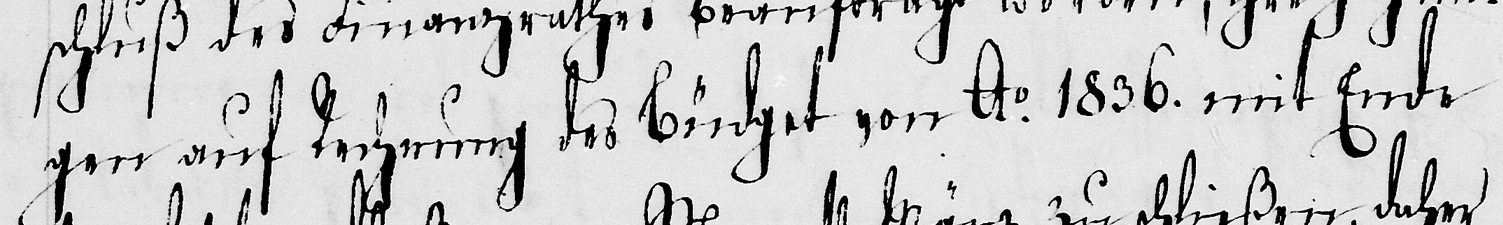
gen auf Rechnung des Büdget von Ao. 1836. mit Ende
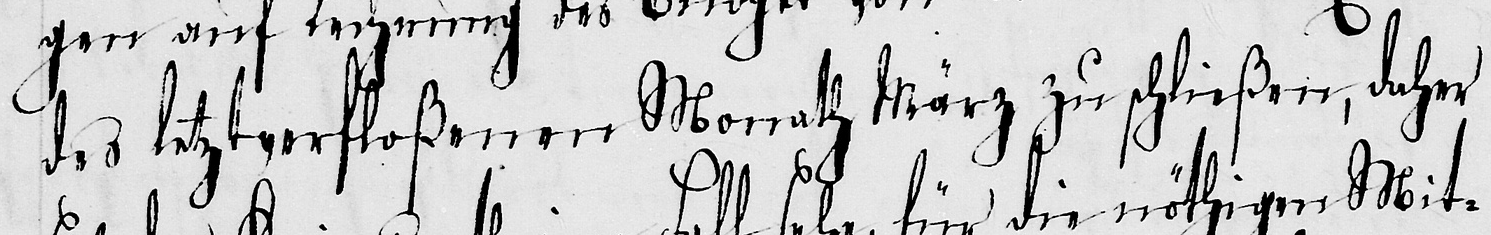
des letztverfloßenen Monath März zu schließen, daher
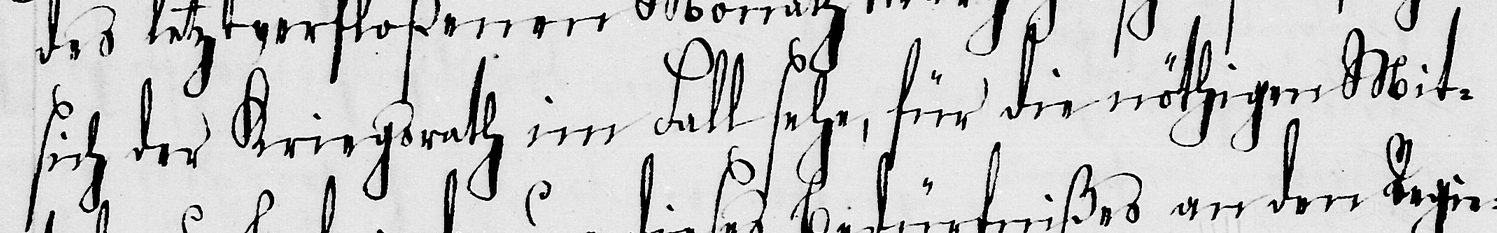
sich der Kriegsrath im Fall sehe, für die nöthigen Mit¬
